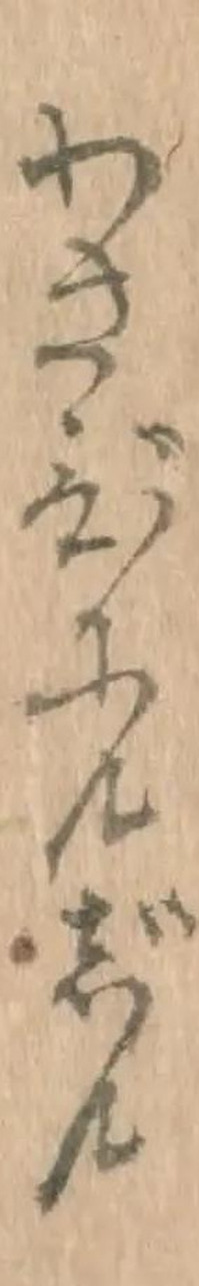わさびにんじん
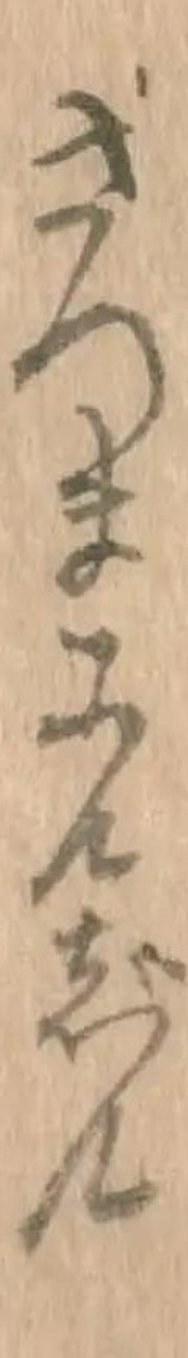さつまにんじん
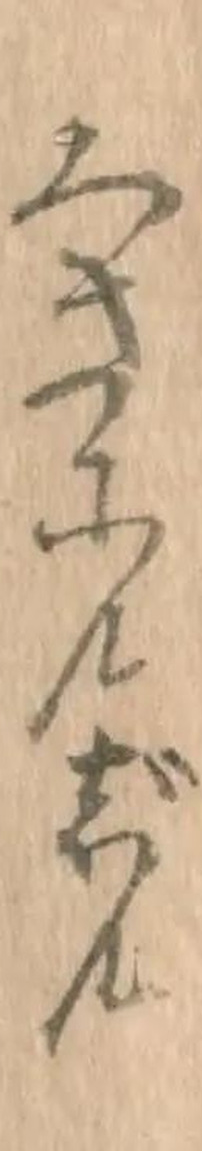くさにんじん
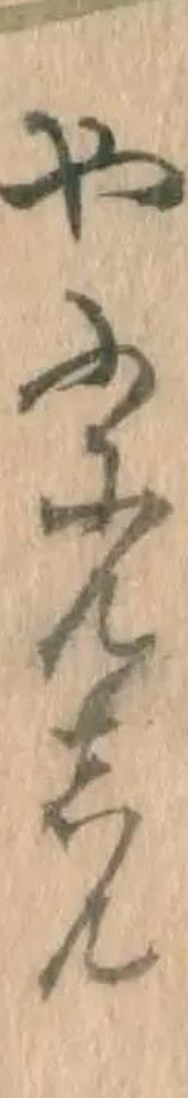やふにんしん
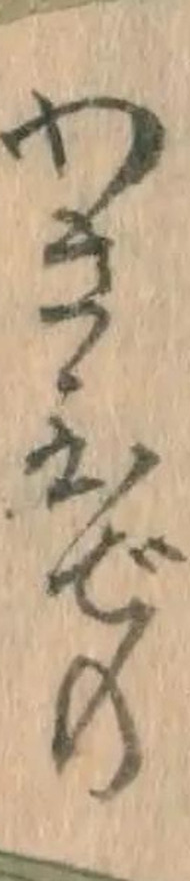わさひでの
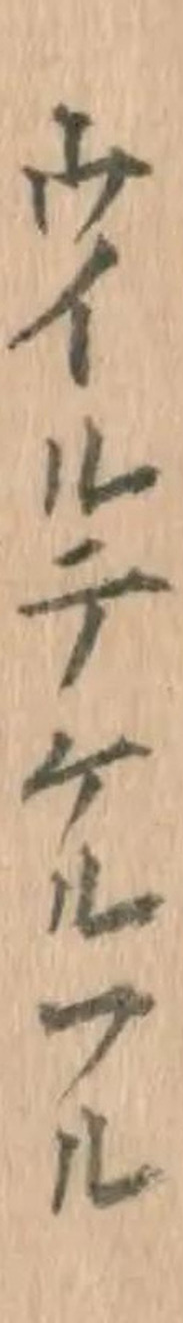ウイルテケルフル
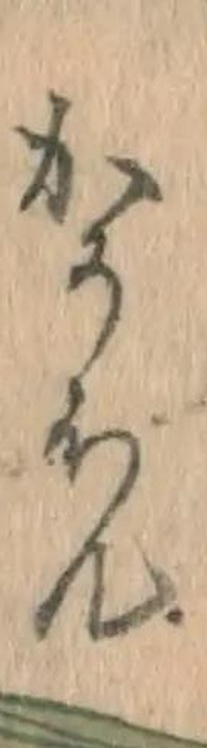かうほん
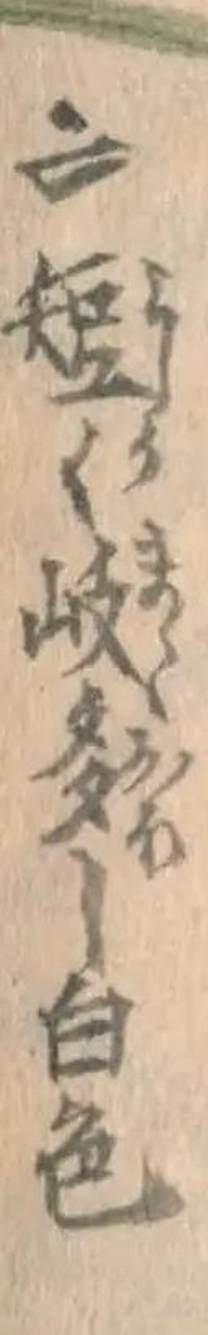・▭短く岐多し白色
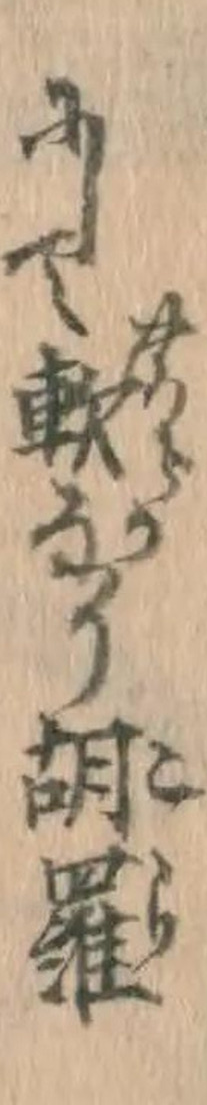にして軟なり胡蘿
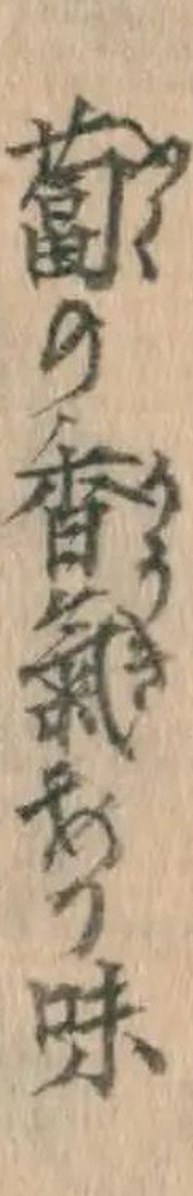蔔の香気あり味
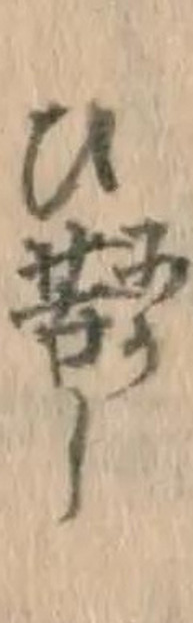ひ苦し
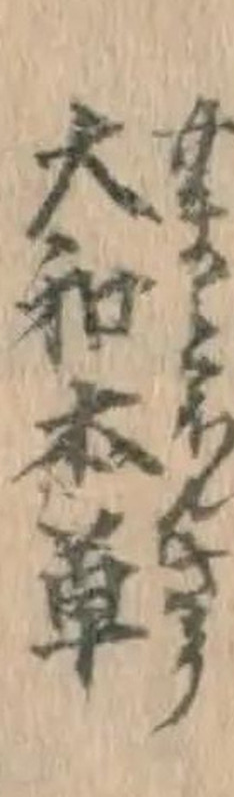大和本草
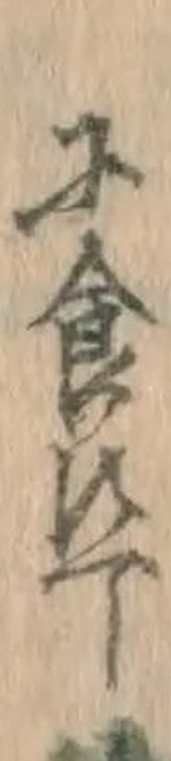に食すへし
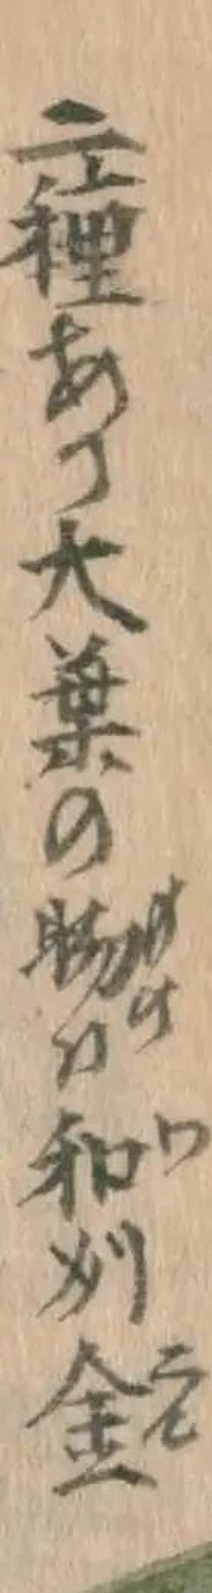二種あり大葉の物は和州金
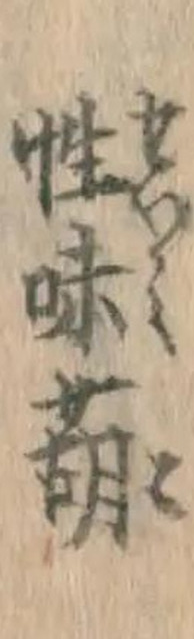性味葫
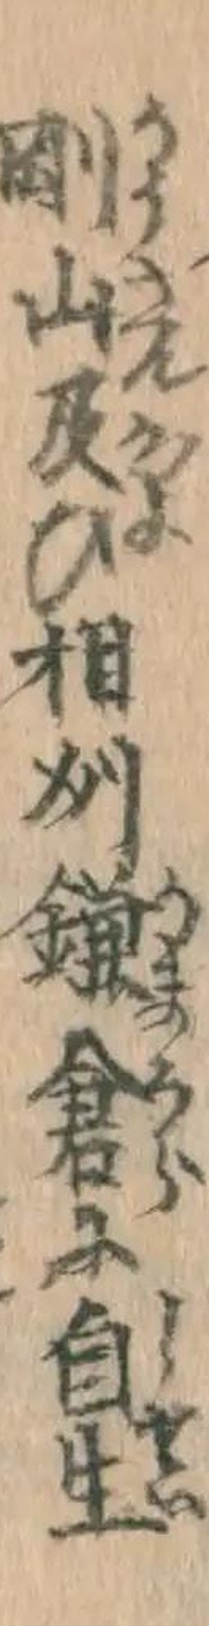剛山及ひ相州鎌倉に自生
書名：本草図譜. 巻46-48
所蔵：国立国会図書館 National Diet Library, JAPAN
